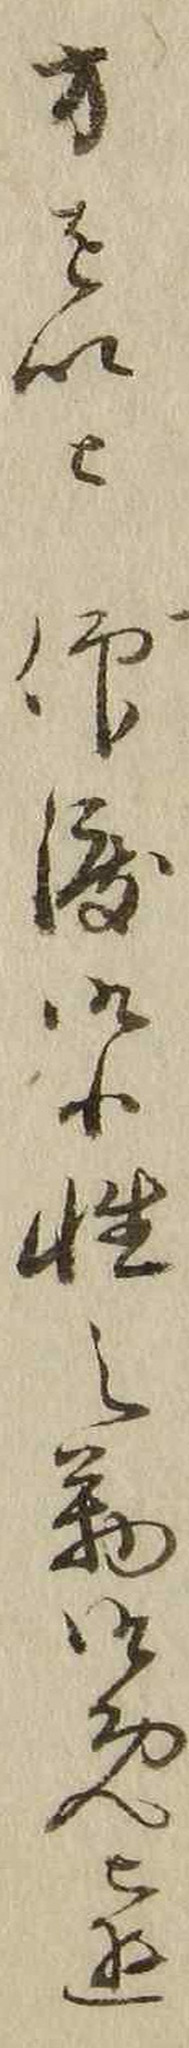方を以被仰渡御小性之勤御免被遊
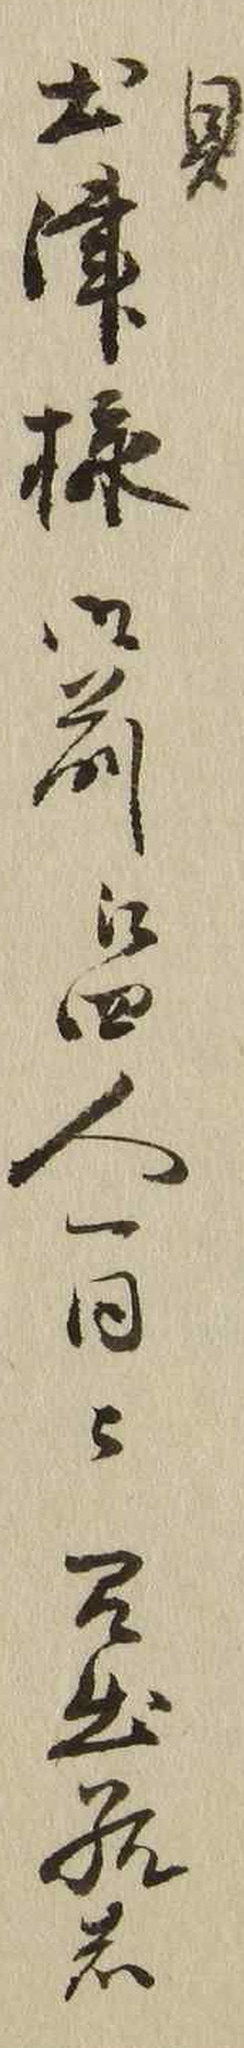土津様御前江四人一同被召出若者
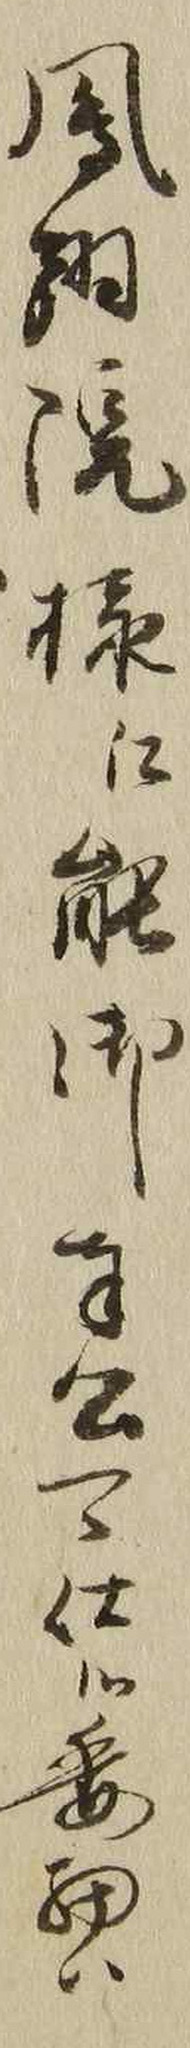鳳翔院様江能御奉公可仕候委細ハ
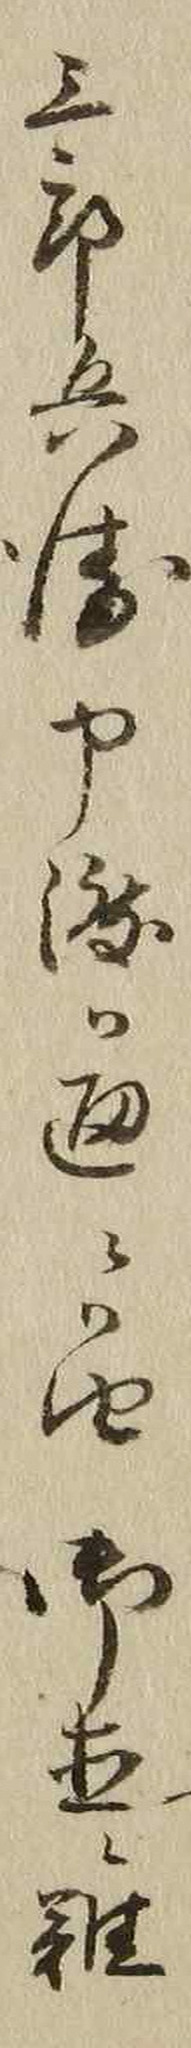三郎兵衛申渡候通ニ候由御直ニ難
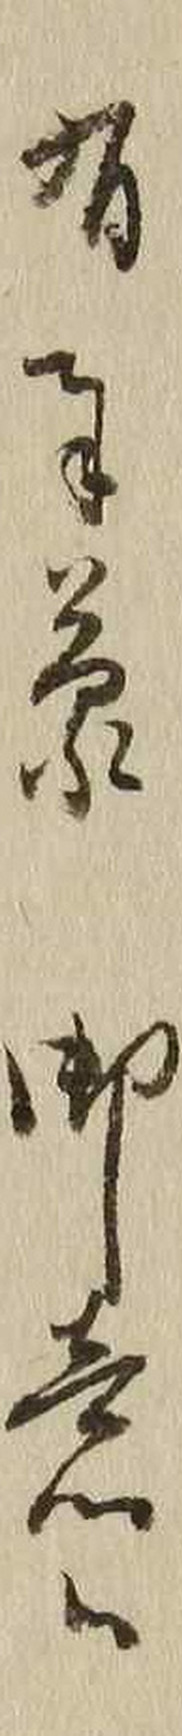有奉蒙御意候
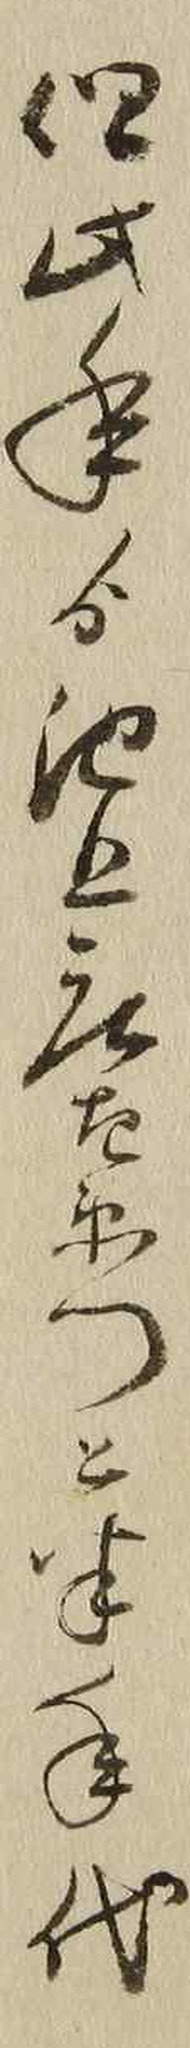但此年ゟ池上庄左衛門と半年代
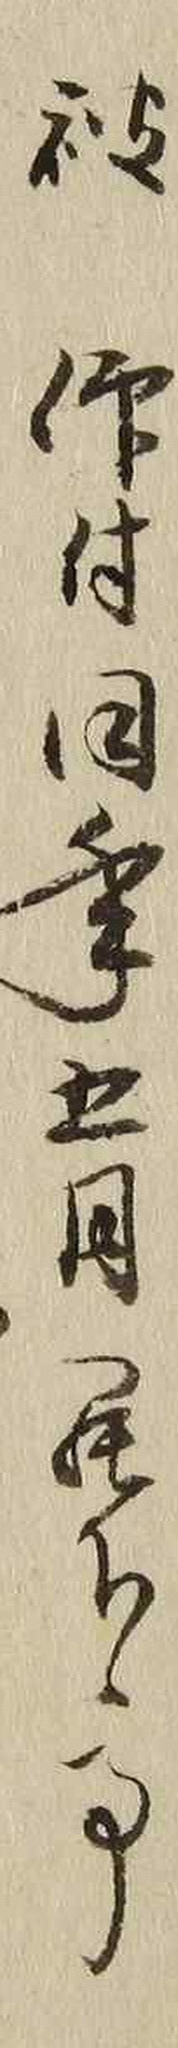被仰付同年五月罷下候事
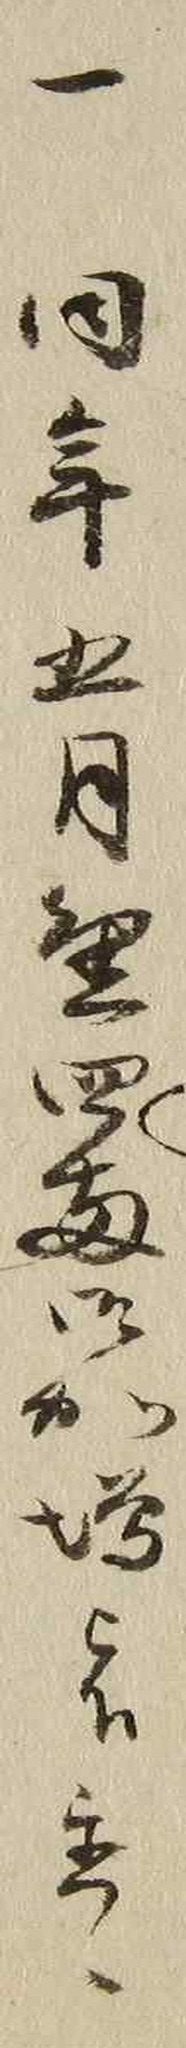一同年五月金四両御加増被下置候
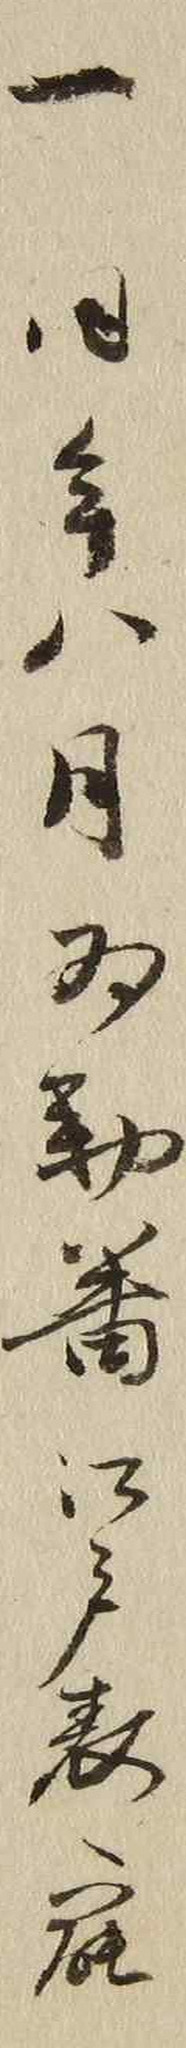一同年八月為勤番江戸表へ罷
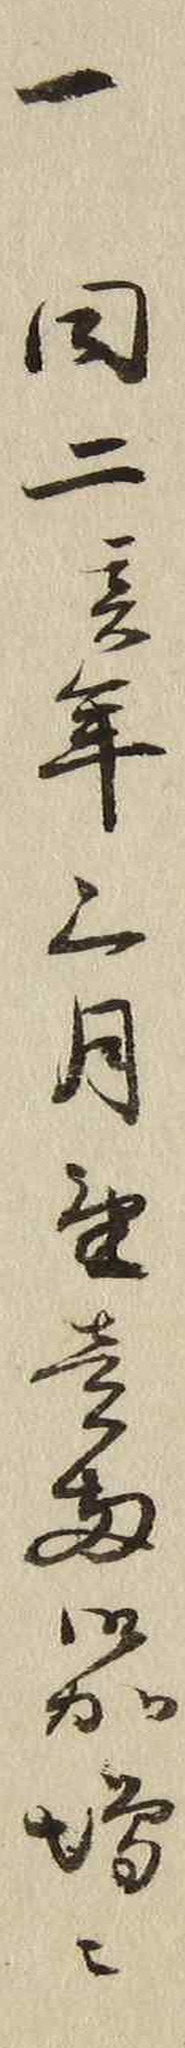一同二亥年三月金壱両御加増被
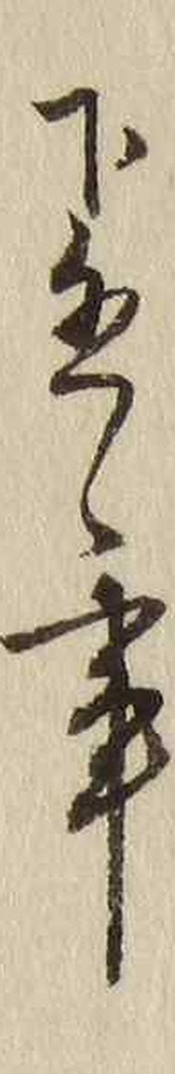下置候事
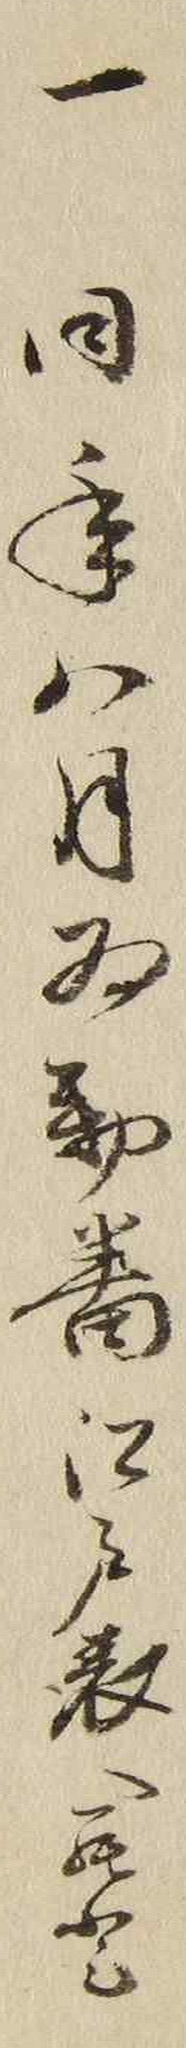一同年八月為勤番江戸表へ罷登
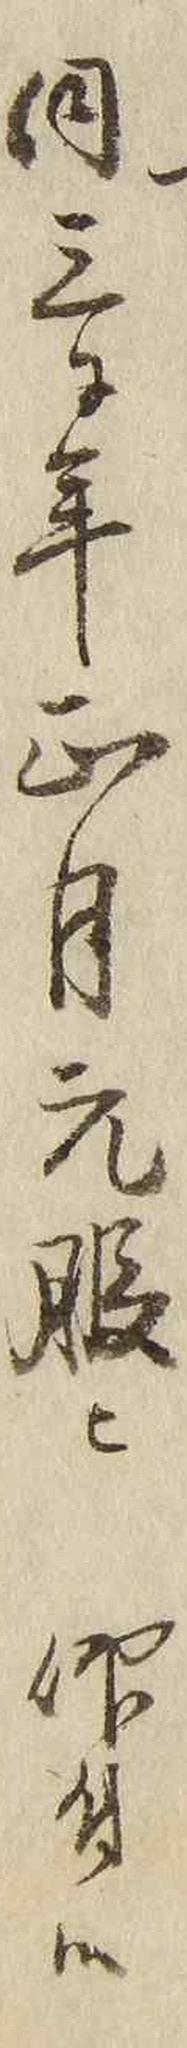一同三子年正月元服被仰付候

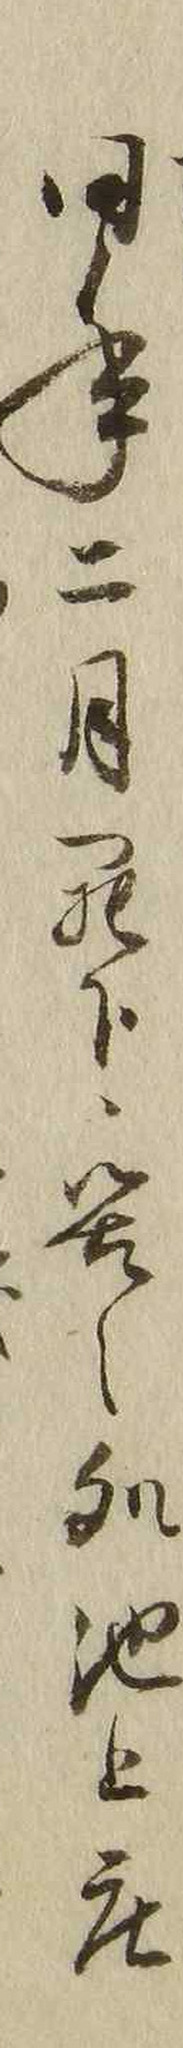一同年二月罷下候筈之処池上庄
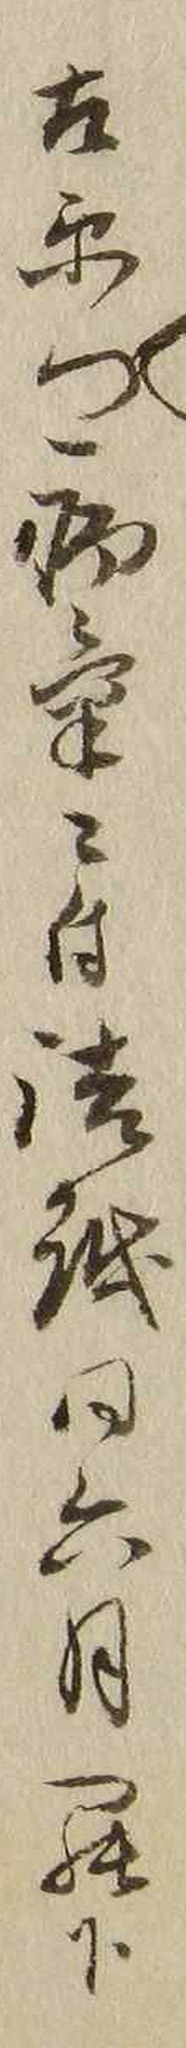左衛門病気ニ付詰越同六月罷下
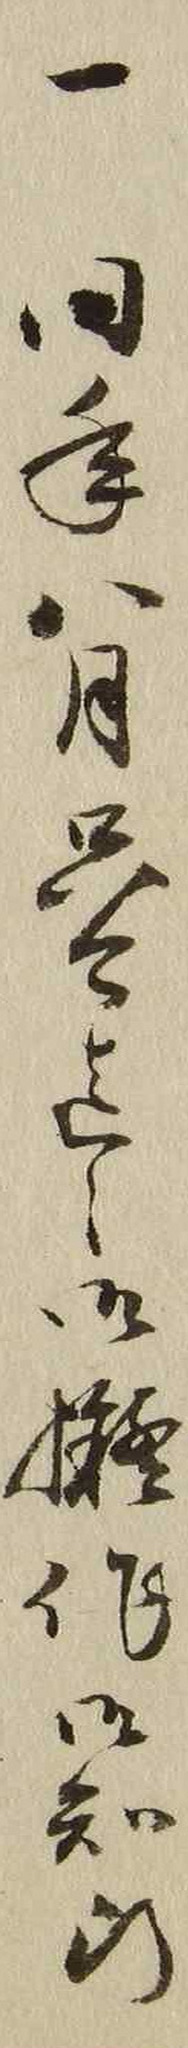一同年八月只今迄之御擬作御知行
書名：諸士系譜　巻之225　ま之部6
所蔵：会津若松市立会津図書館
